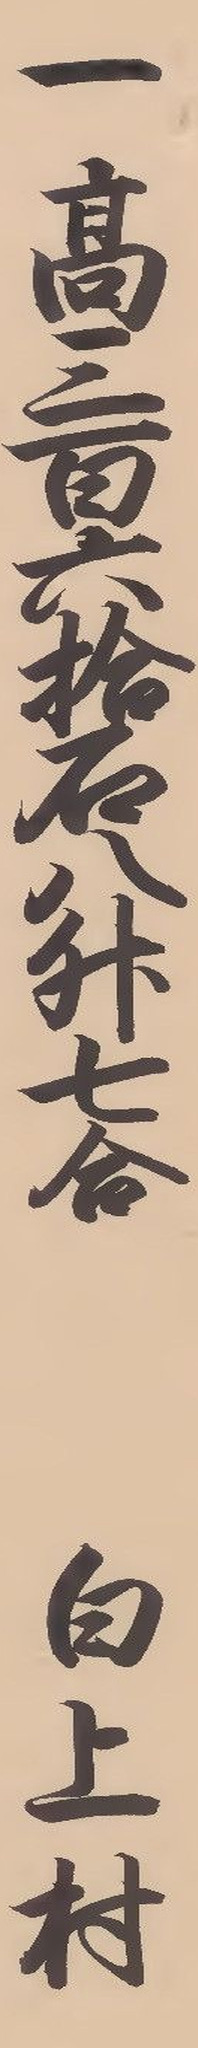一髙三百六拾石八升七合白上村
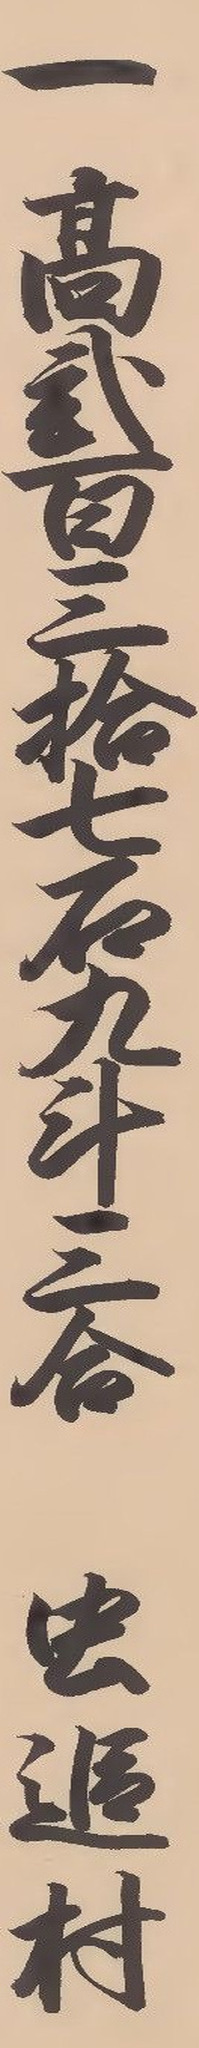一髙弐百三拾七石九斗三合虫追村
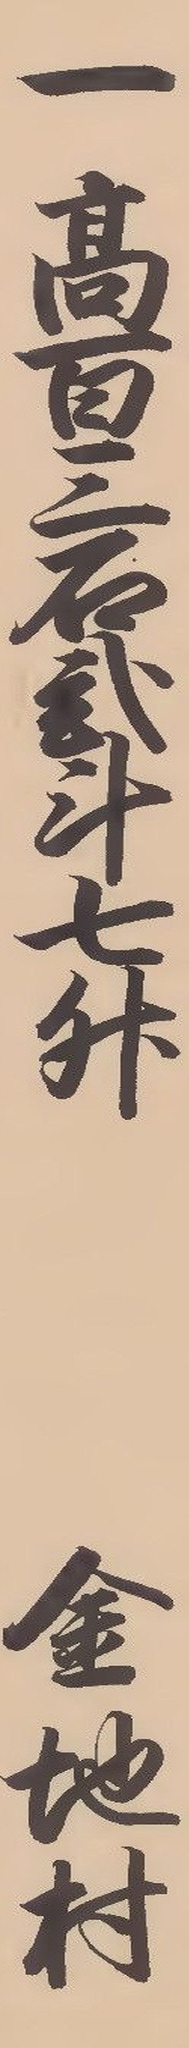一髙百三石弐斗七升金地村
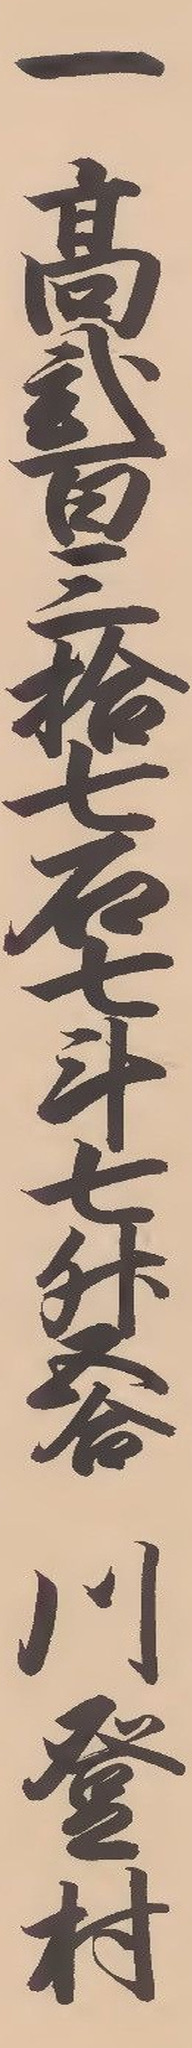一髙弐百三拾七石七斗七升五合川登村
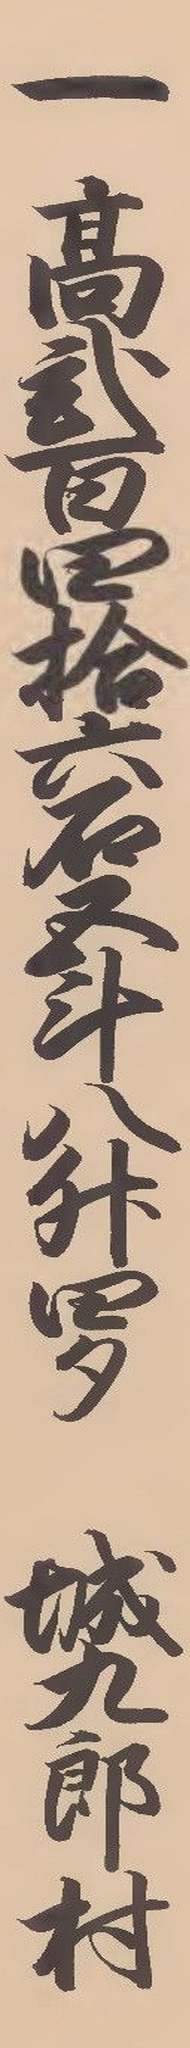一髙弐百四拾六石五斗八升四夕城九郎村
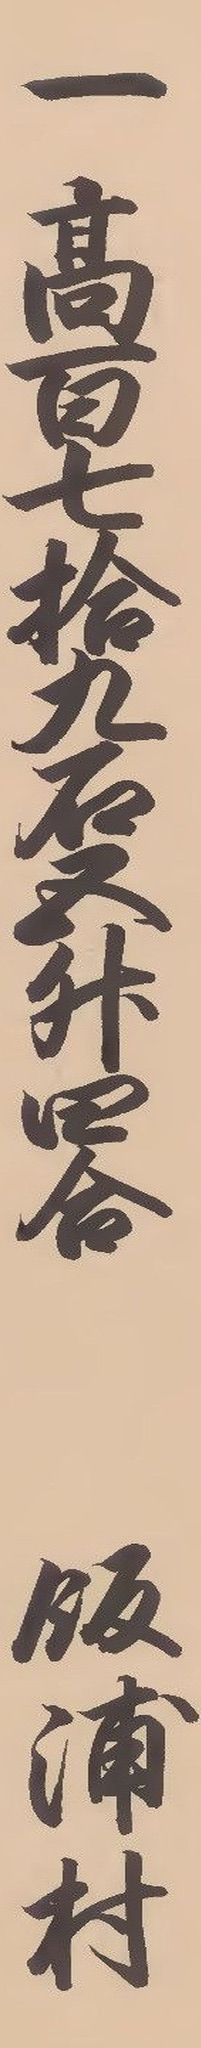一髙百七拾九石五升四合飯浦村
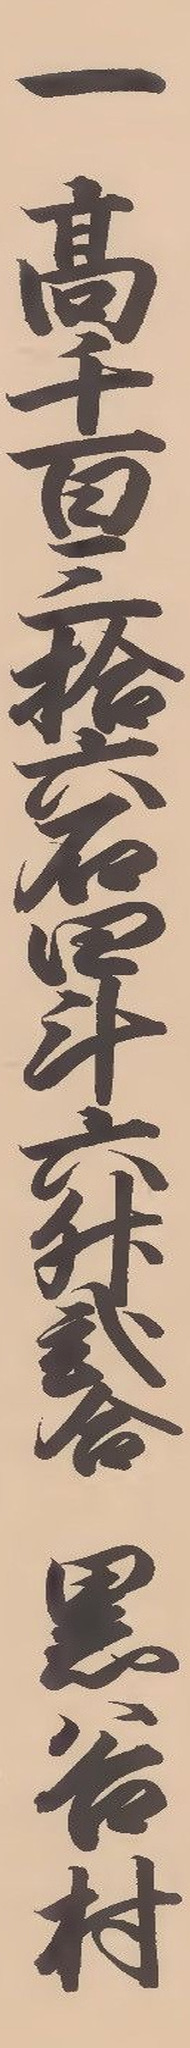一髙千百三拾六石四斗六升弐合黑谷村
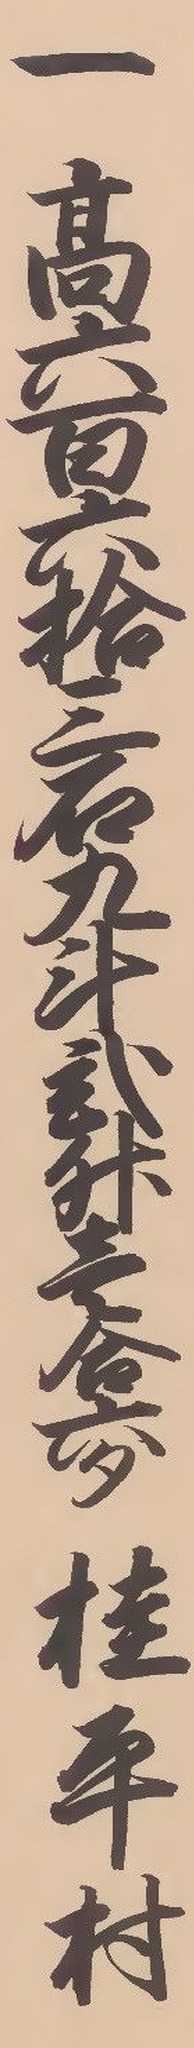一髙六百六拾三石九斗弐升壱合六夕桂平村

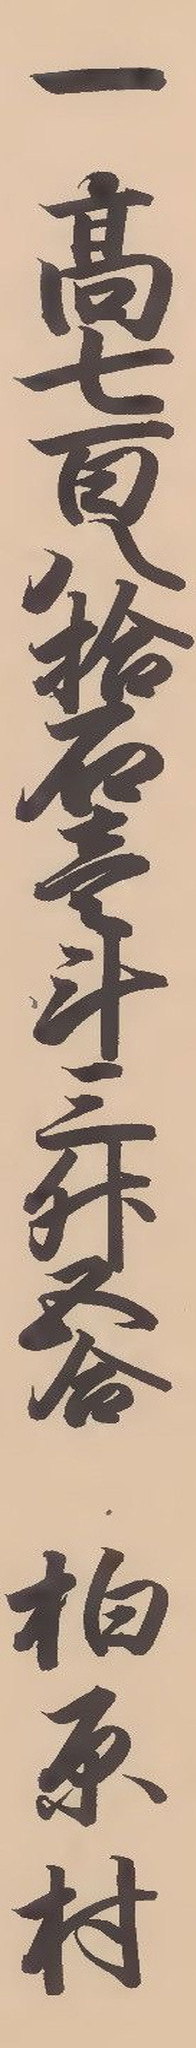一髙七百八拾石壱斗三升五合柏原村
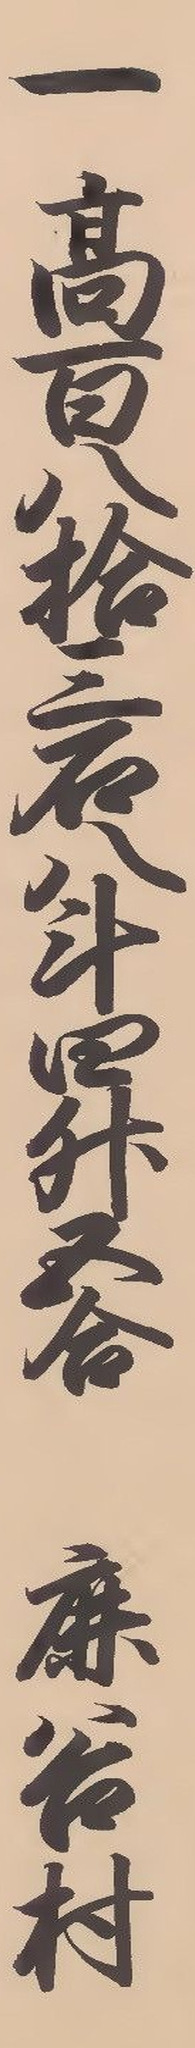一髙百八拾三石八斗四升五合鹿谷村
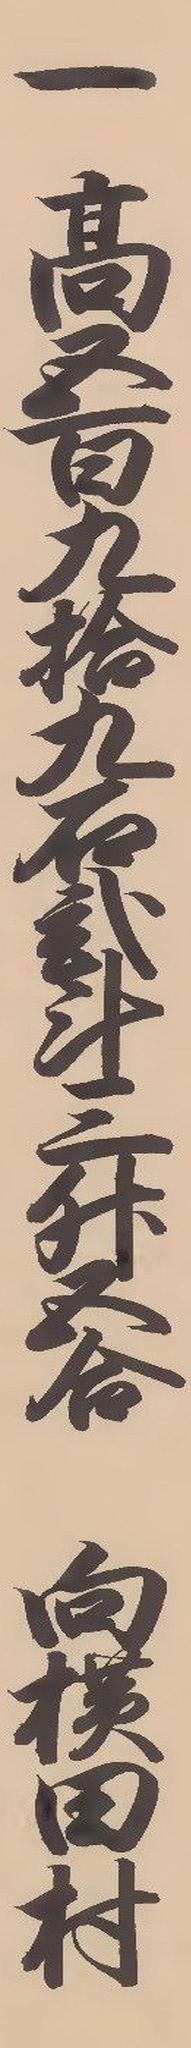一髙五百九拾九石弐斗三升五合向横田村
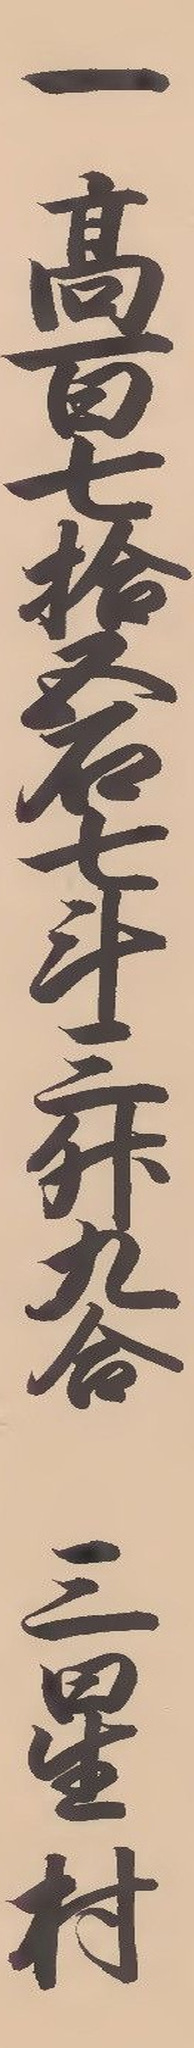一髙百七拾五石七斗三升九合三星村
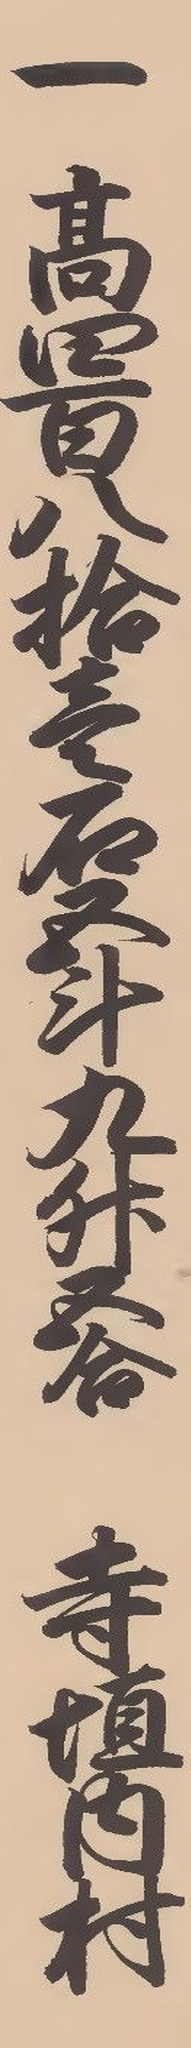一髙四百八拾壱石五斗九升五合寺垣内村
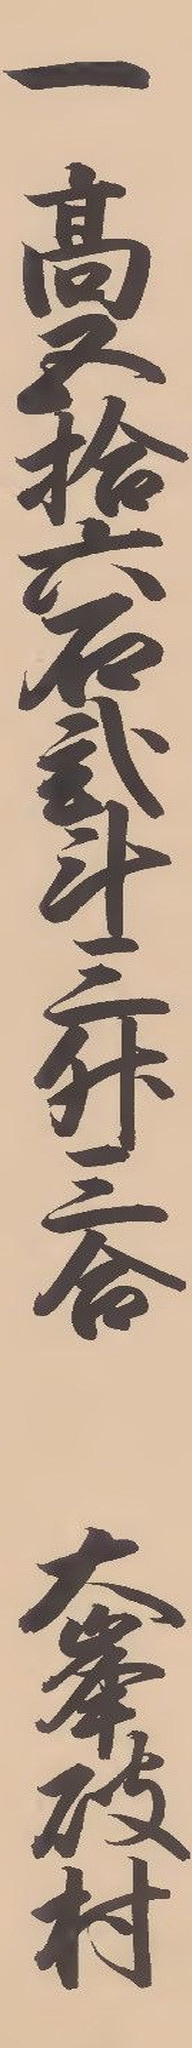一髙五拾六石弐斗三升三合大峯破村
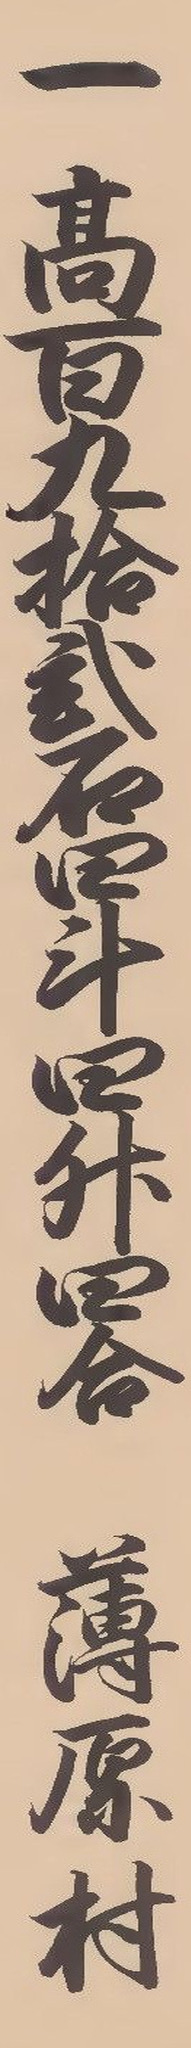一髙百九拾弐石四斗四升四合薄原村
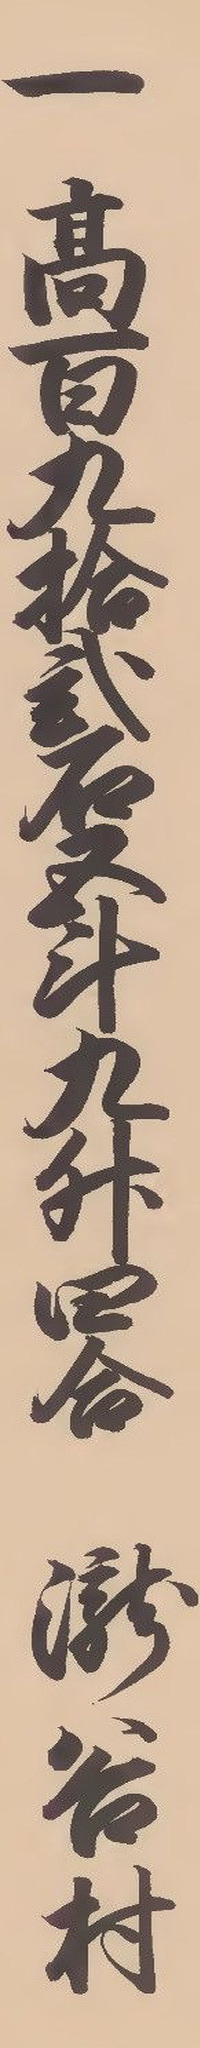一髙百九拾弐石五斗九升四合瀧谷村
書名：石見国郷帳
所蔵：国立公文書館 National Archives of Japan
